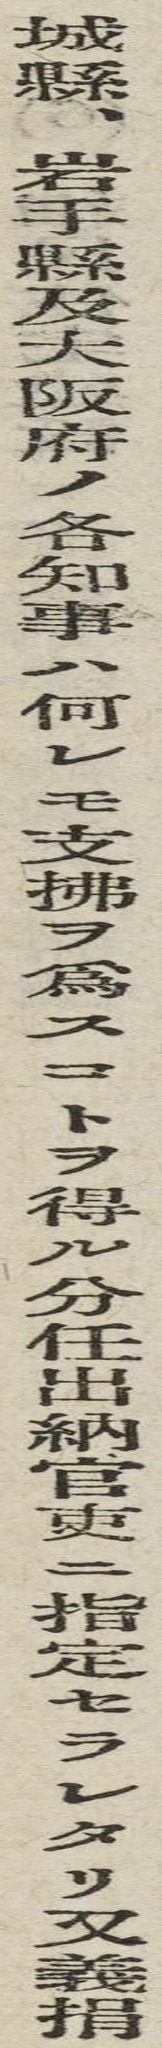城県、岩手県及大阪府ノ各知事ハ何レモ支払ヲ為スコトヲ得ル分任出納官吏ニ指定セラレタリ又義捐
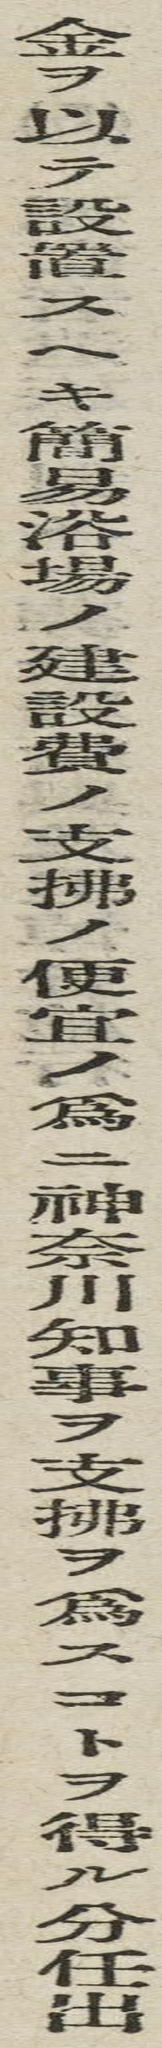金ヲ以テ設置スヘキ簡易浴場ノ建設費ノ支払ノ便宜ノ為ニ神奈川県知事ヲ支払ヲ為スコトヲ得ル分任出
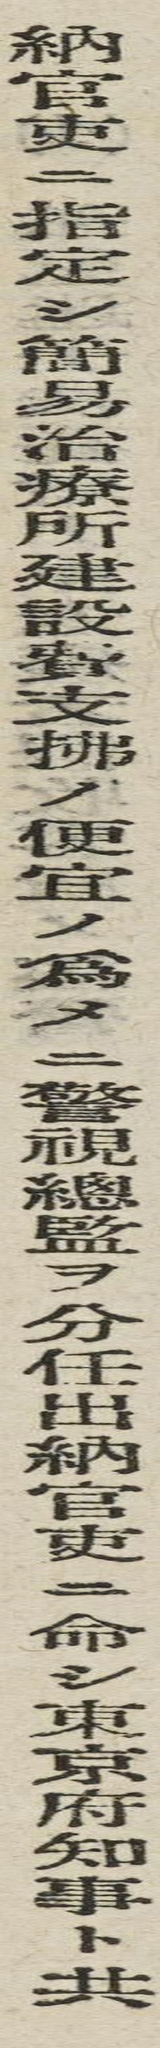納官吏ニ指定シ簡易治療所建設支払ノ便宜ノ為メニ警視総監ヲ分任出納官吏ニ命シ東京府知事ト共
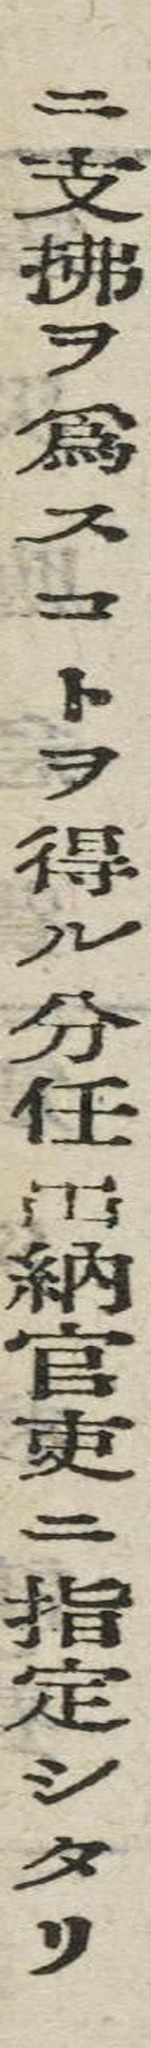ニ支払ヲ為スコトヲ得ル分任出納官吏ニ指定シタリ
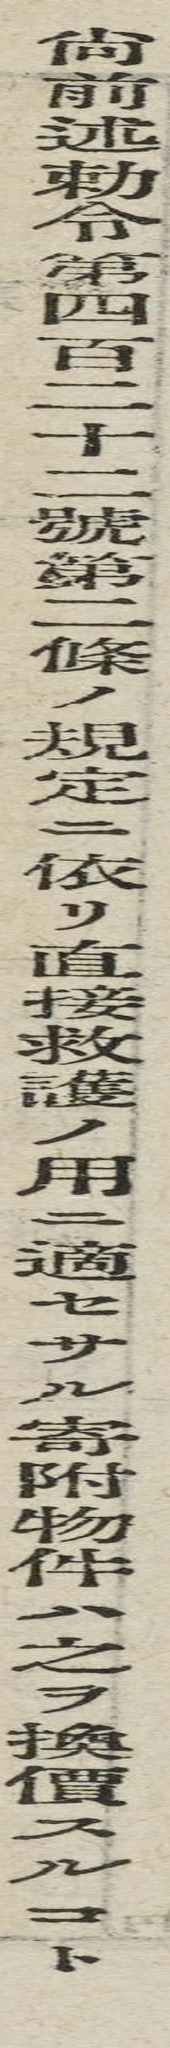尚前述勅令第四百二十二号第ニ條ノ規定ニ依リ直接救護ノ用ニ適セサル寄附物件ハ之ヲ換価スルコト
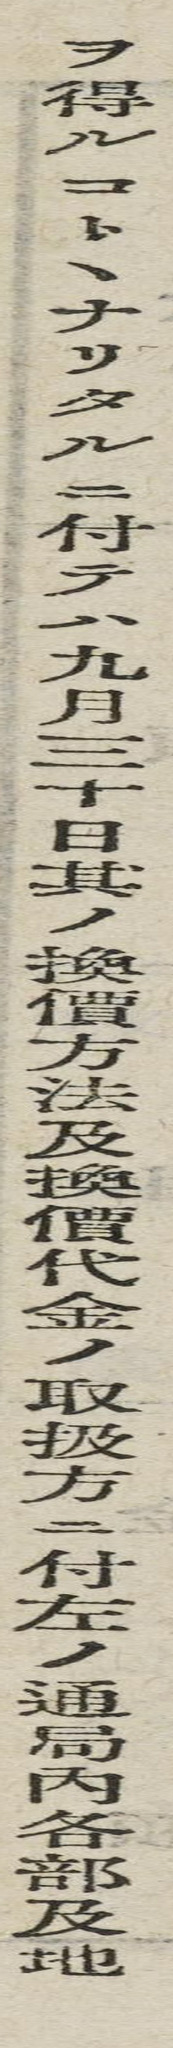ヲ得ルコトヽナリタルニ付テハ九月三十日其ノ換価方法及換価代金ノ取扱方ニ付左ノ通局内各部及地
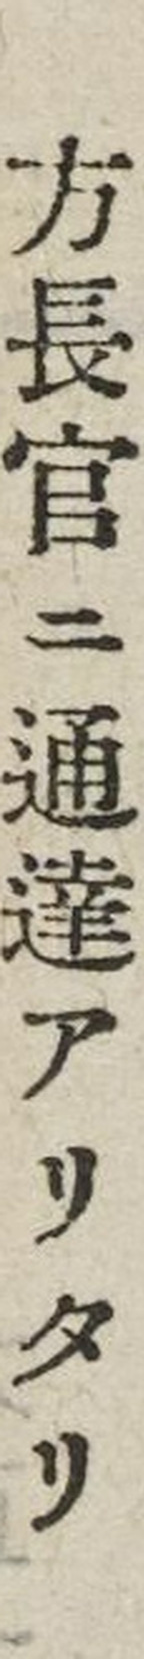報長官ニ通達アリタリ
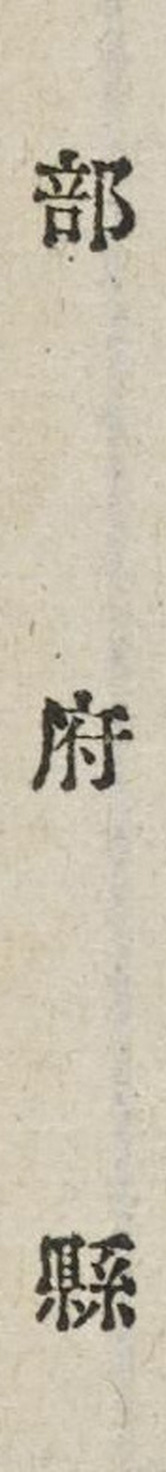部府県
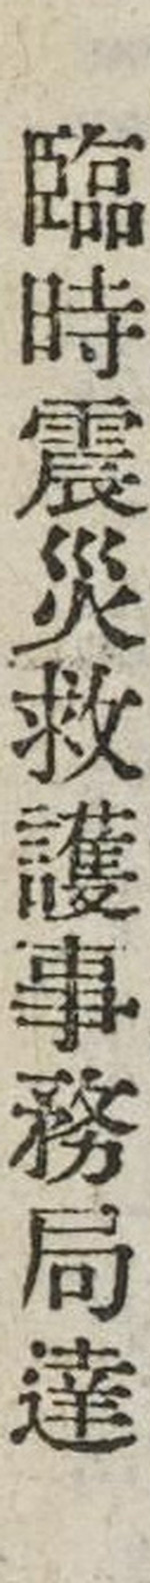臨時震災救護事務局達
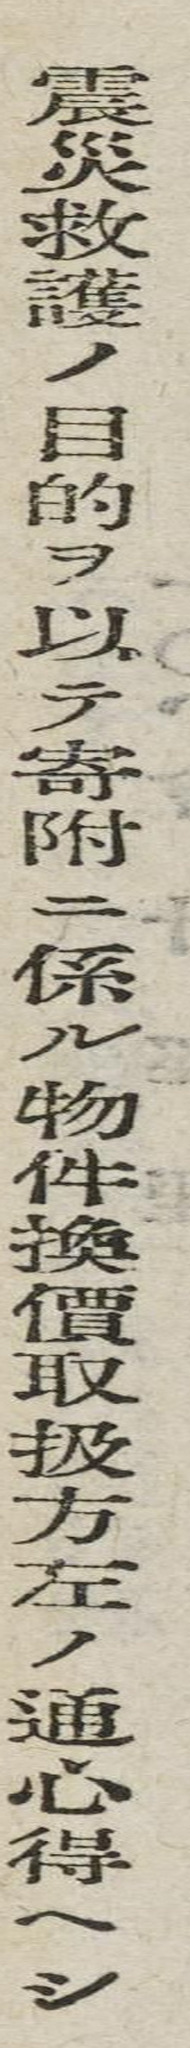震災救護ノ目的ヲ以テ寄附ニ係ル物件換価取扱方左ノ通心得ヘシ
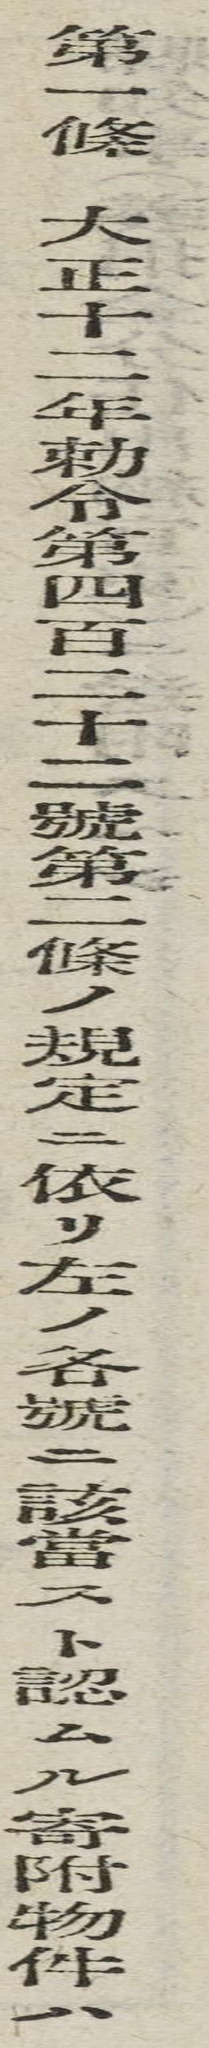第一條大正十二年勅令第四百二十二号第ニ條ノ規定ニ依リ左ノ各号ニ該当スト認ムル寄附物件ハ
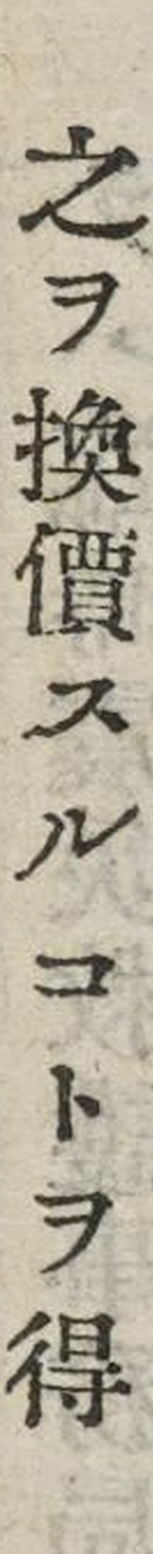之ヲ換価スルコトヲ得
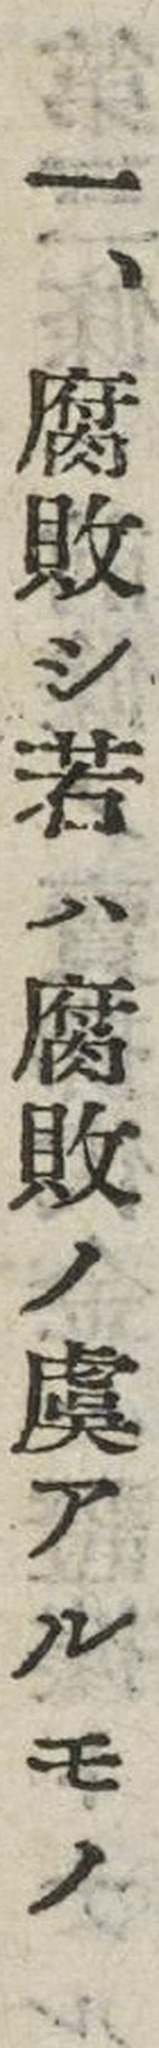一、腐敗シ若ハ腐敗ノ恐アルモノ
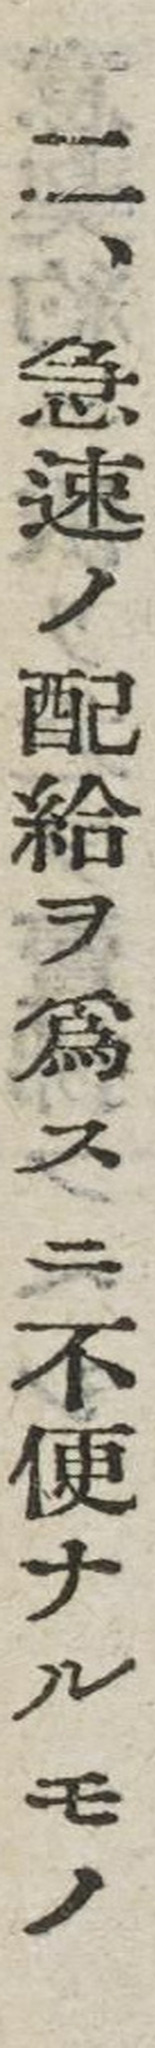ニ、急速ノ配給ヲ為スニ不便ナルモノ
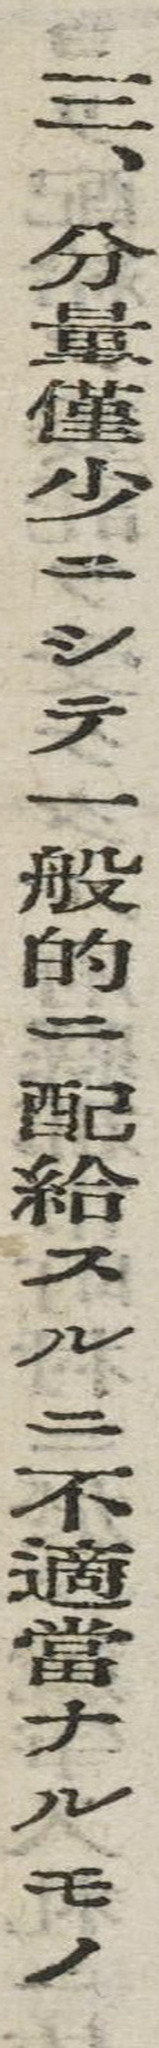三、分量僅少ニシテ一般的ニ配給スルニ不適当ナルモノ
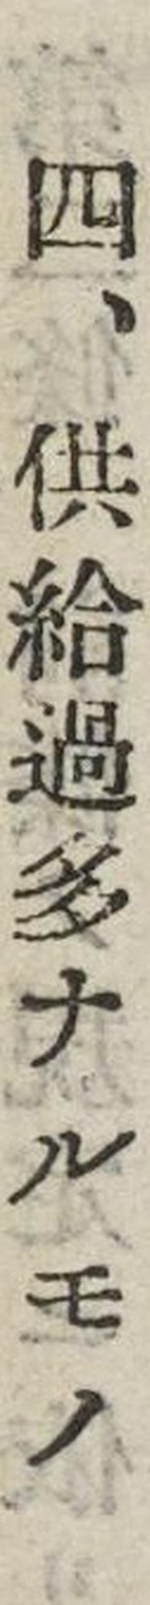四、供給過多ナルモノ
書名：震災被害状況並救護施設概要
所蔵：東京大学地震研究所図書室 Earthquake Research Institute Library, The University of Tokyo, JAPAN
